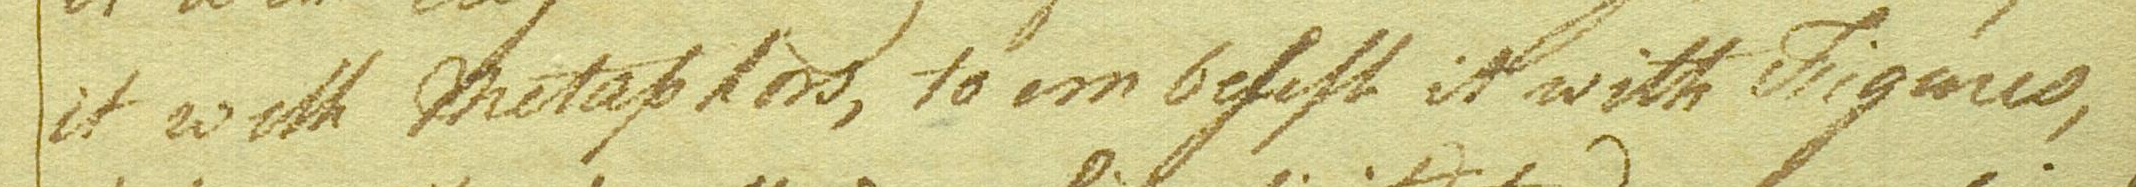it with Metaphors, to embelish it with Figures,
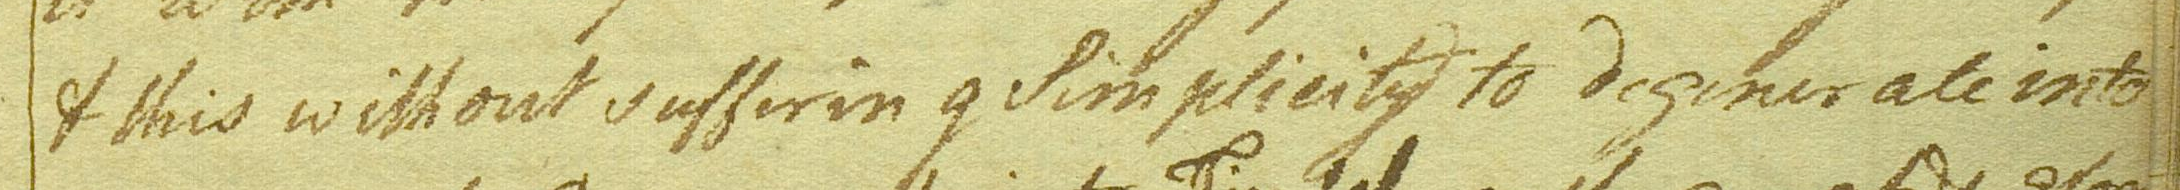& this without suffering Simplicity to degenerate into
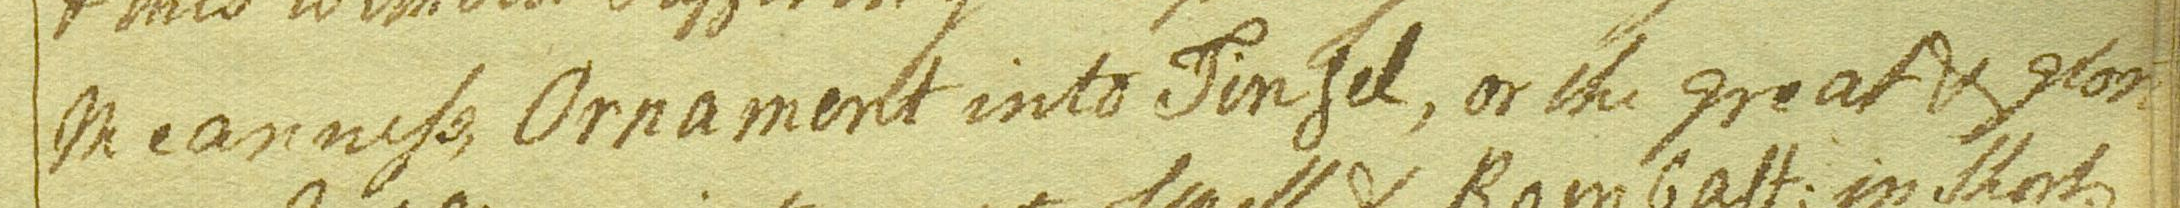Meanness, Ornament into Tinsel, or the great & glor
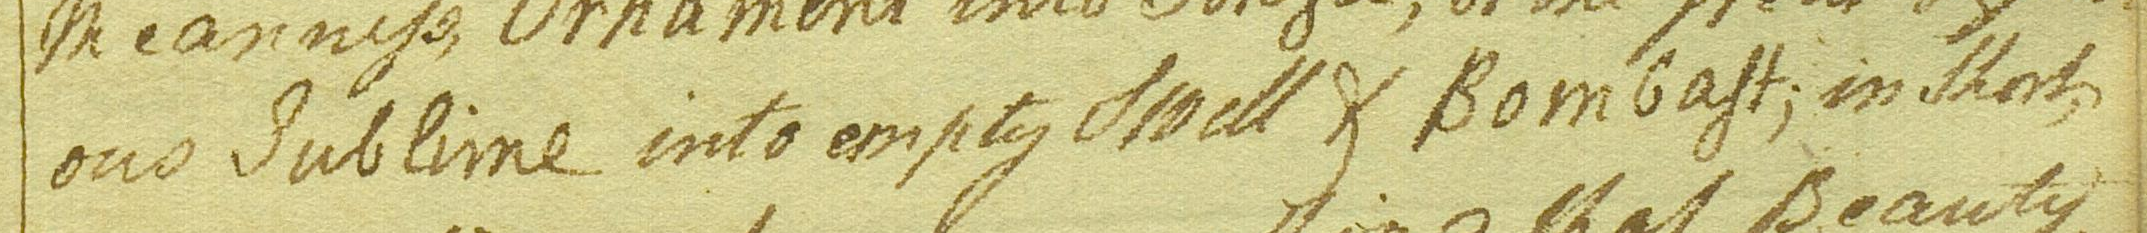ous Sublime into empty Shell & Bombast; in short
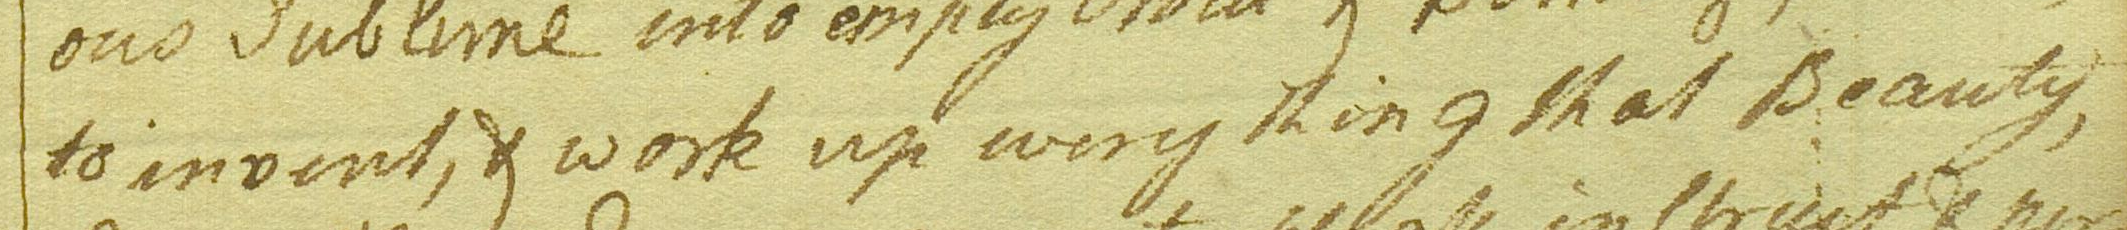to invent, & work up every thing that Beauty,
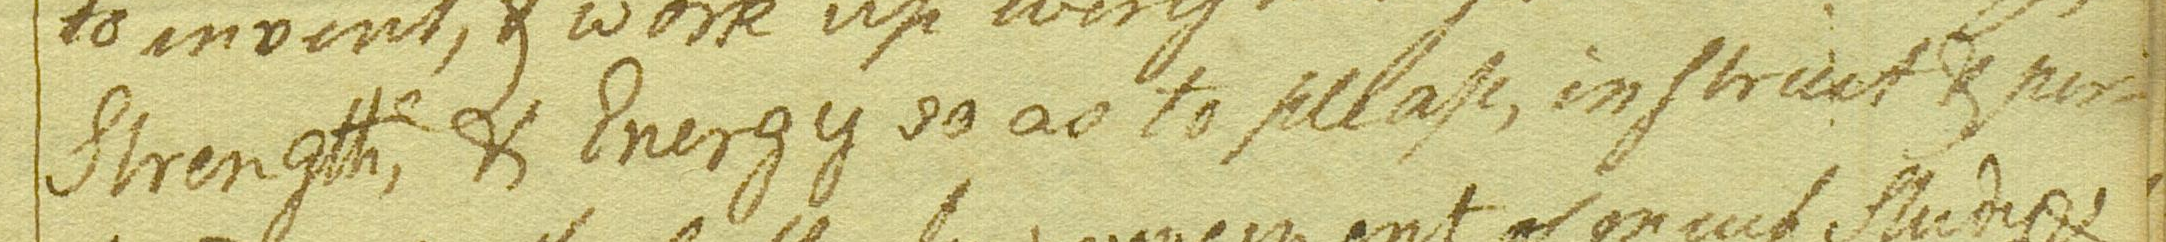Strength, & Energy so as to please, instruct & per-
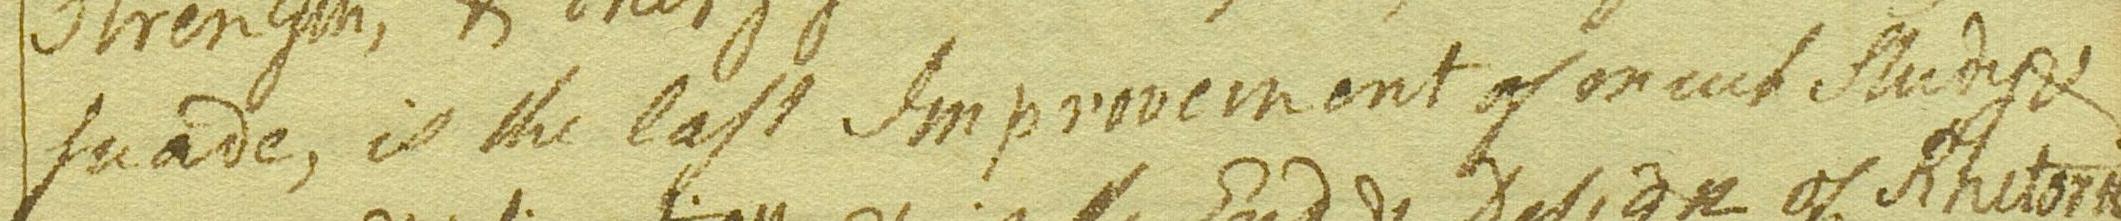suade, is the last Improvement of on such Study &
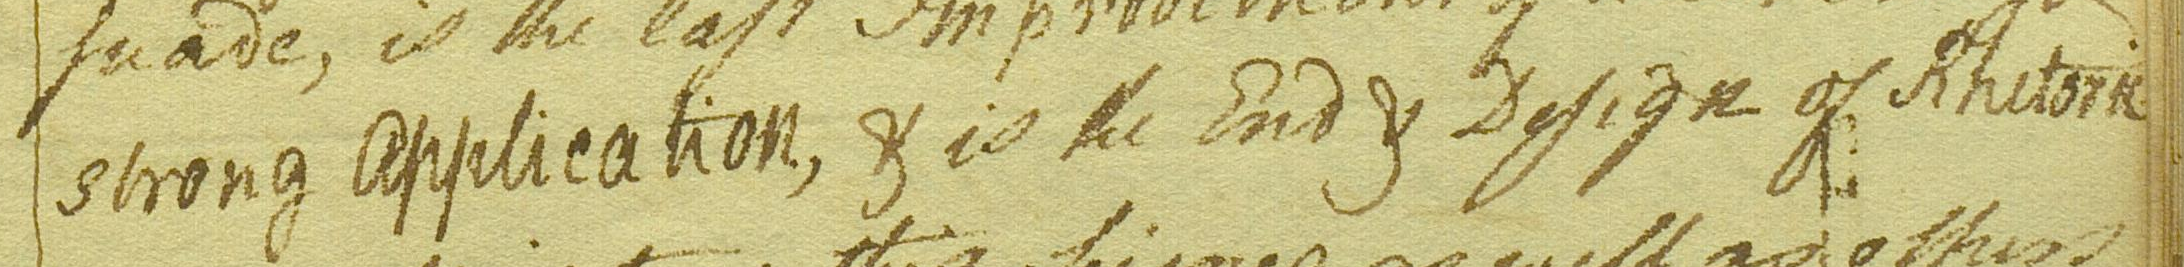strong Application, & is the End & Design of Rhetoric
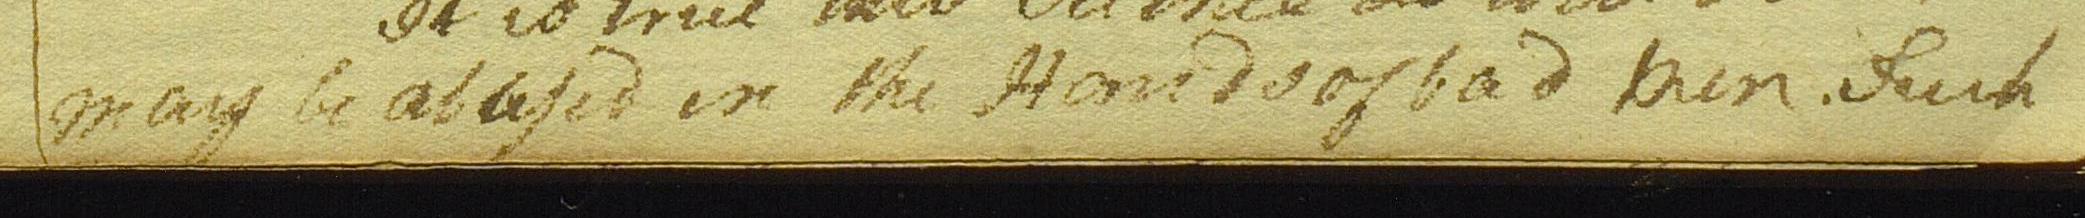may be abused in the Hands of bad men. Such
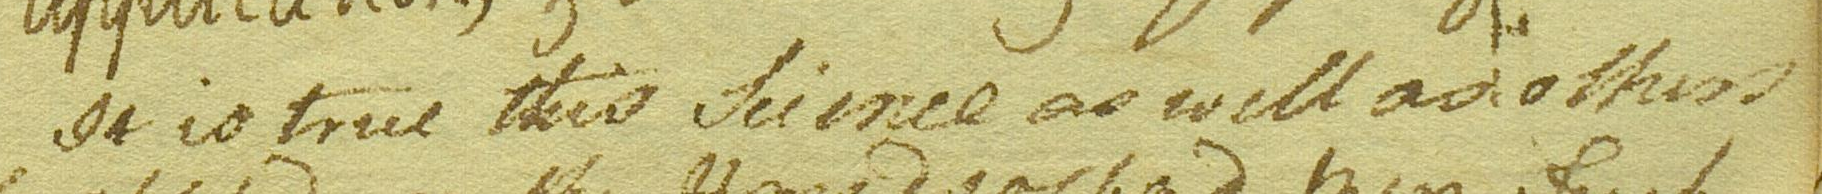It is true this Science as well as others
